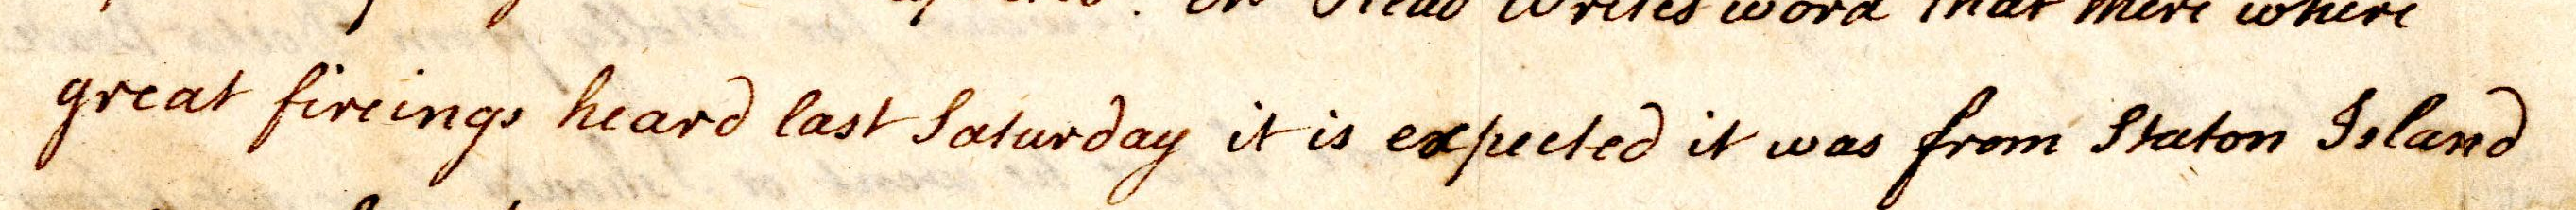great fireings heard last Saturday it is expected it was from Staton Island
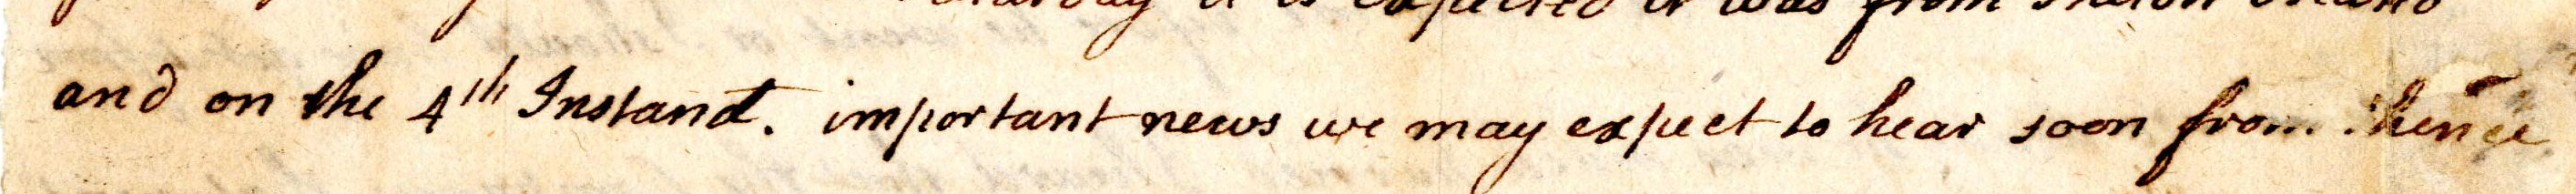and on the 4^th. Instant. important news we may expect to hear soon from thence
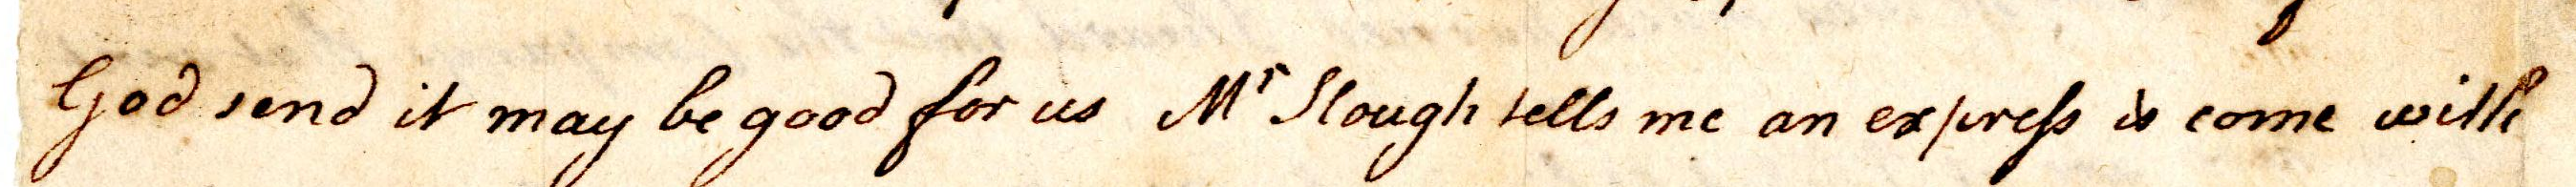God send it may be good for us M^r Slough tells me an express is come with
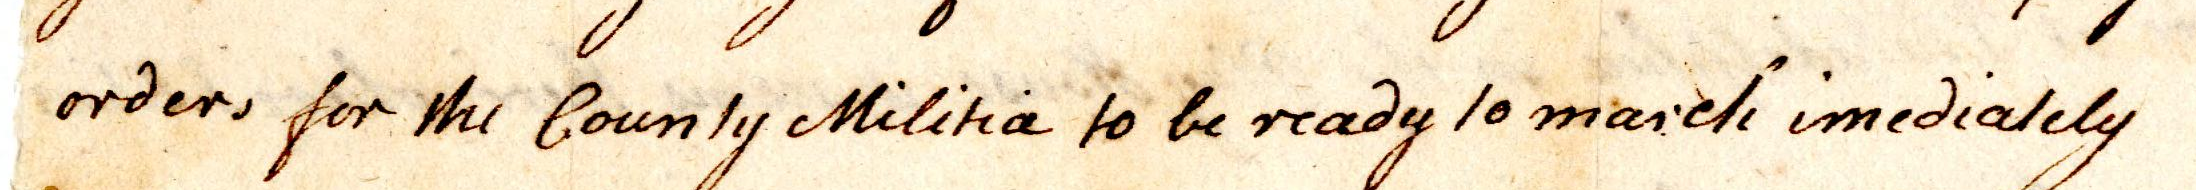orders for the County Militia to be ready to march imediately
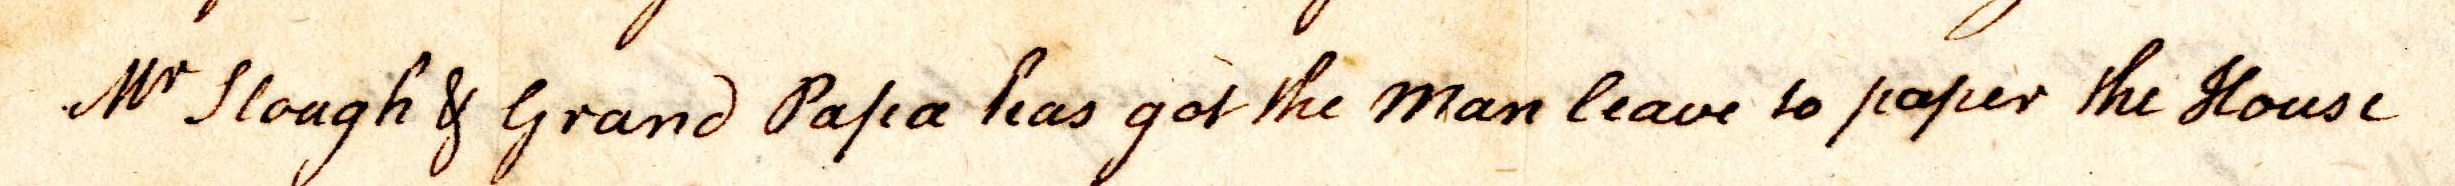M^r Slough & Grand Papa has got the man leave to paper the House
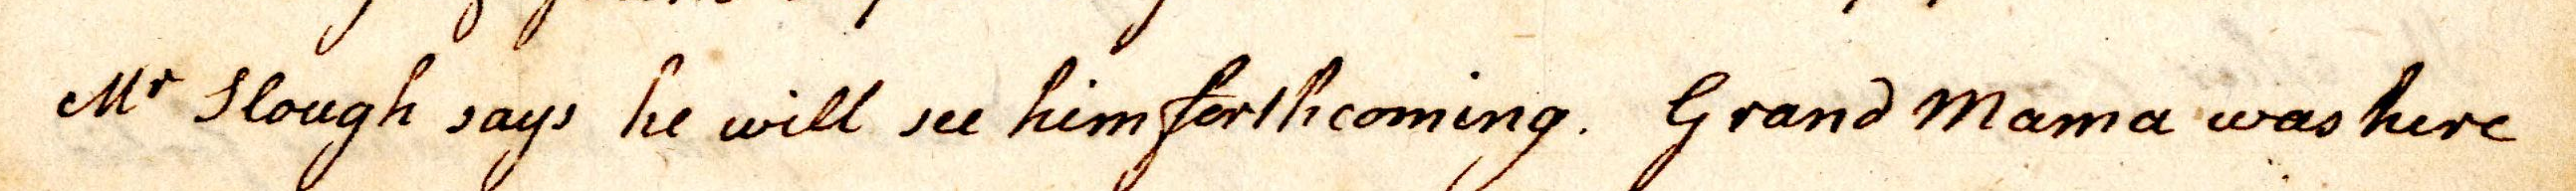M^r Slough says he will see him forthcoming. Grand Mama was here
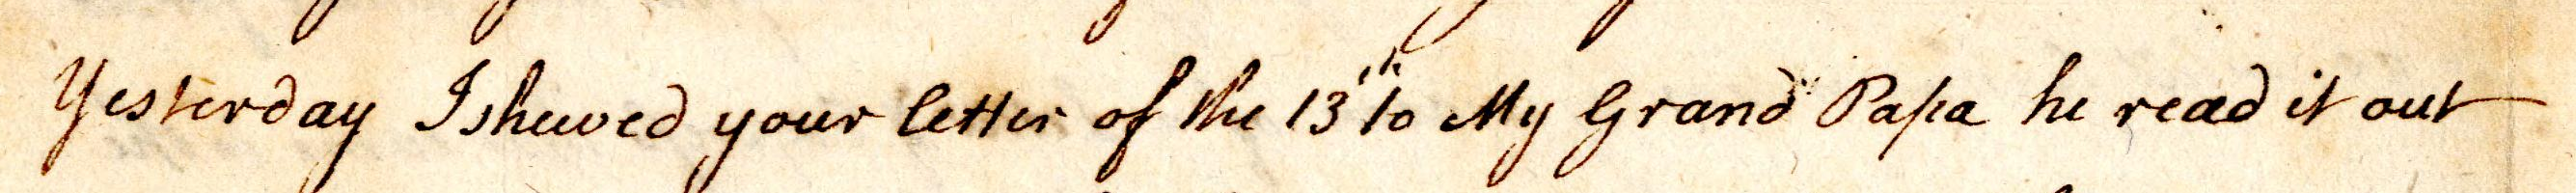Yesterday I shewed your letter of the 13^th to My Grand Papa he read it out
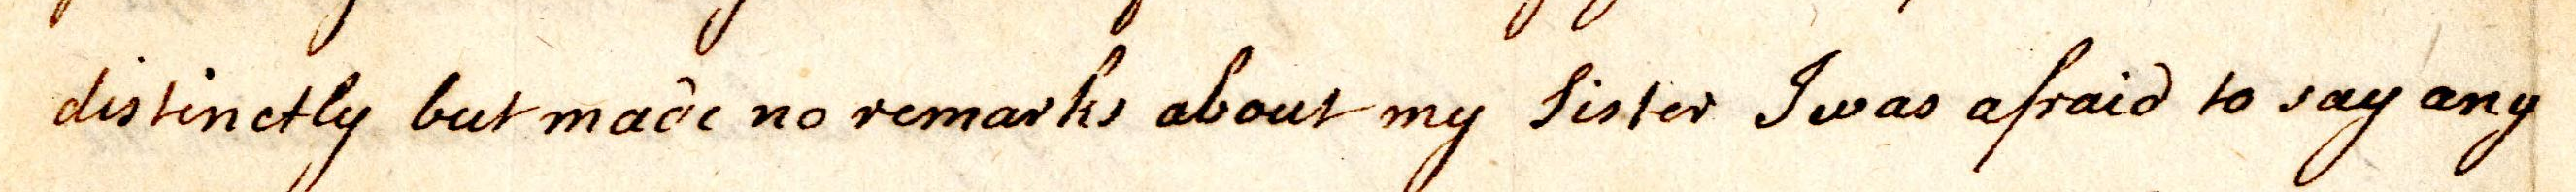distinctly but made no remarks about my Sister I was afraid to say any
